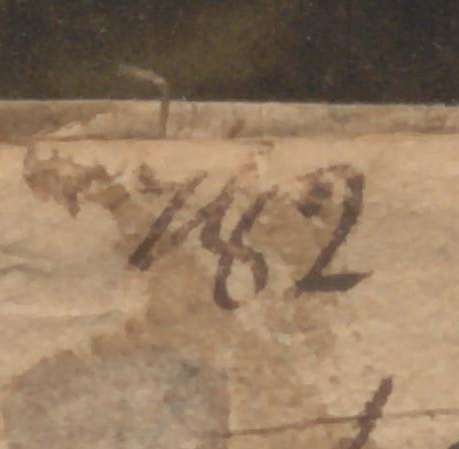1782
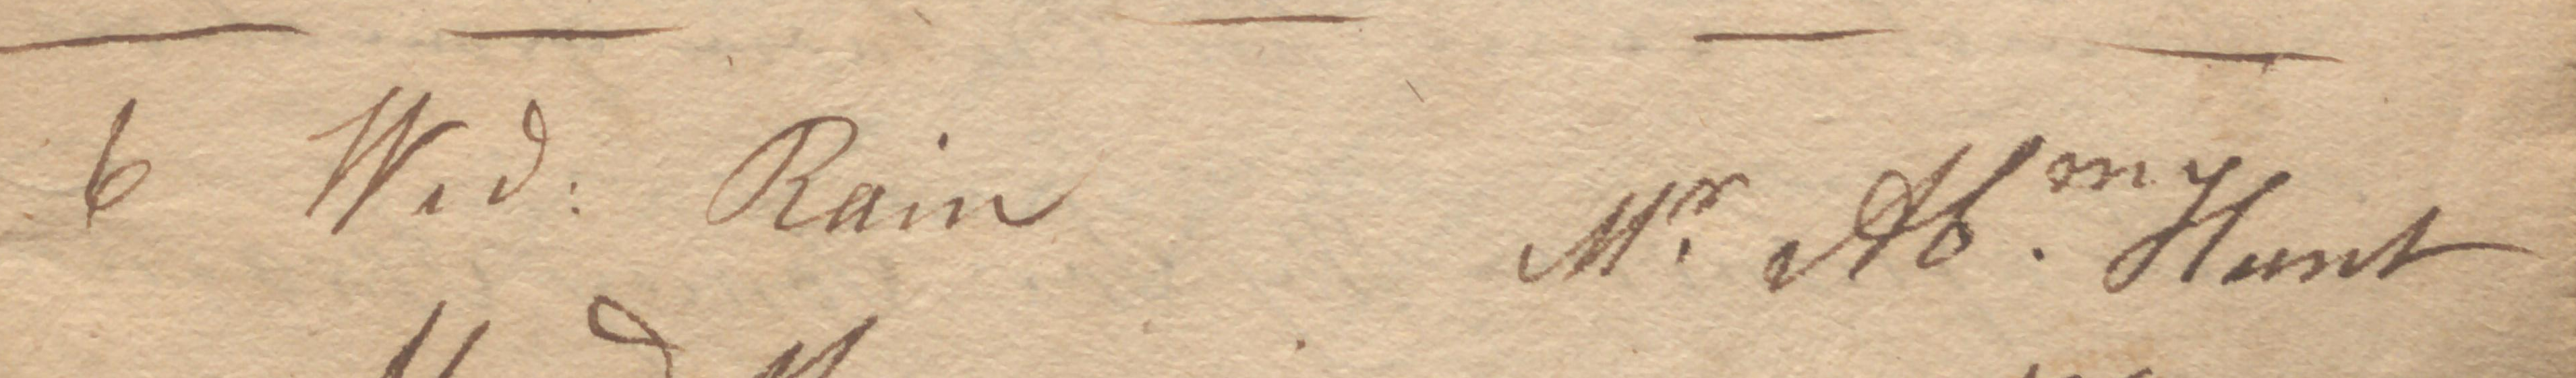6 Wed. Rain M^r. Ab^m. Hunt
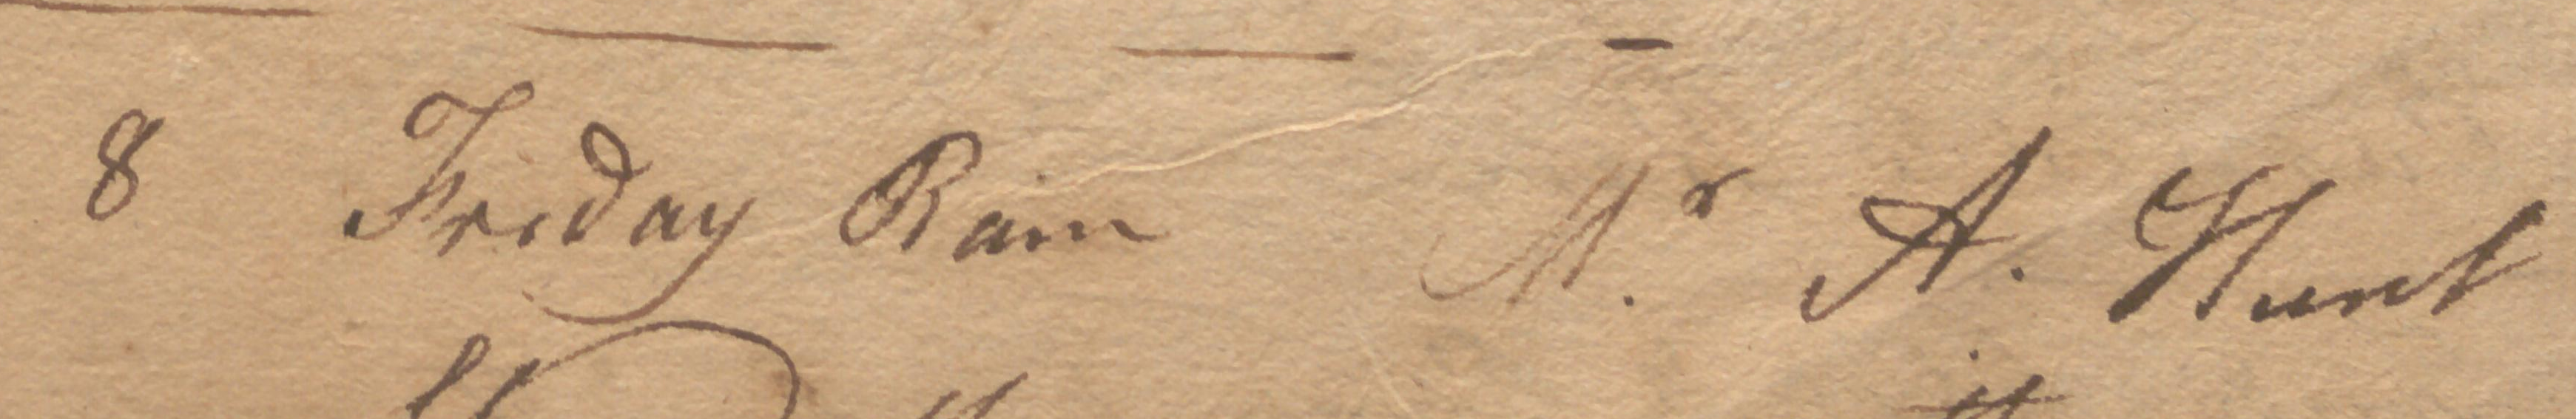8 Friday Rain M^r. A. Hunt
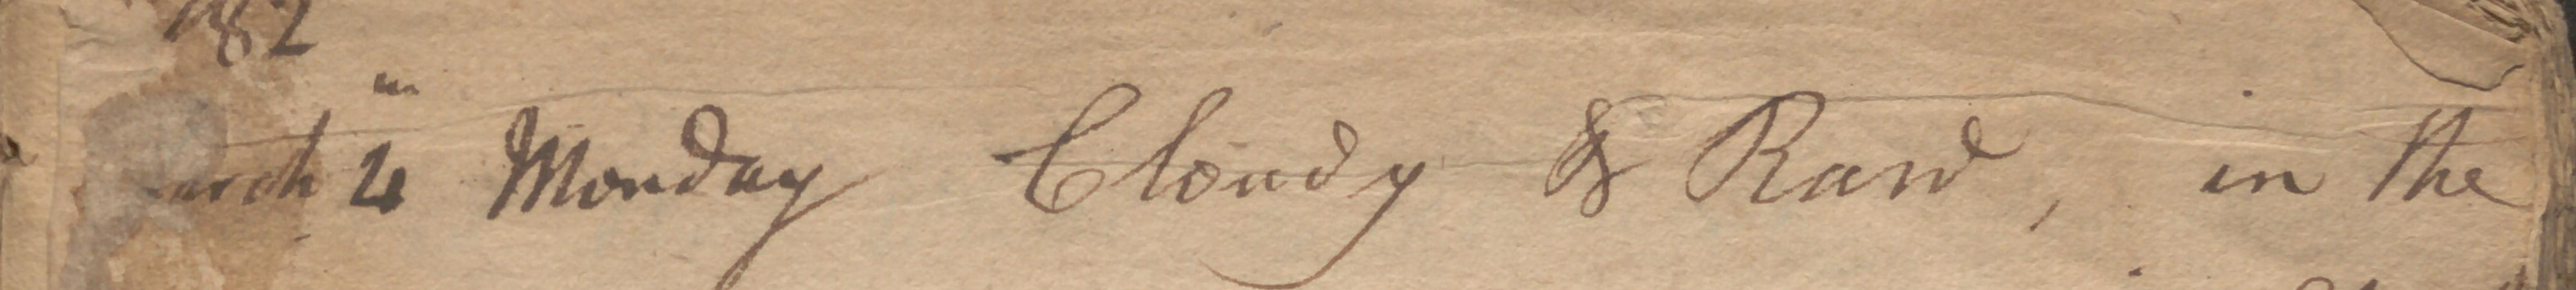March 21^th Monday Cloudy & Raw, in the
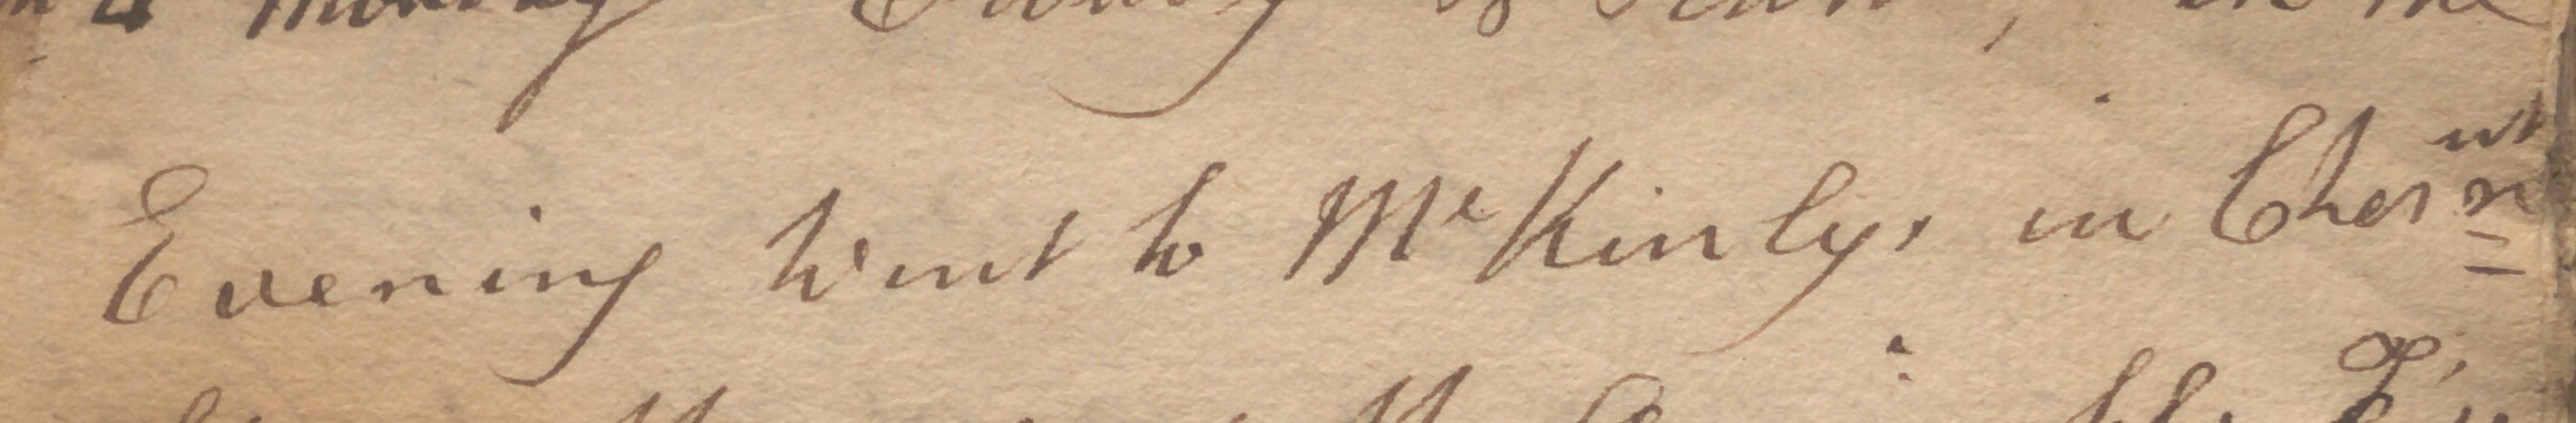Evening went to M^r Kinlys in Chesn^ut.
